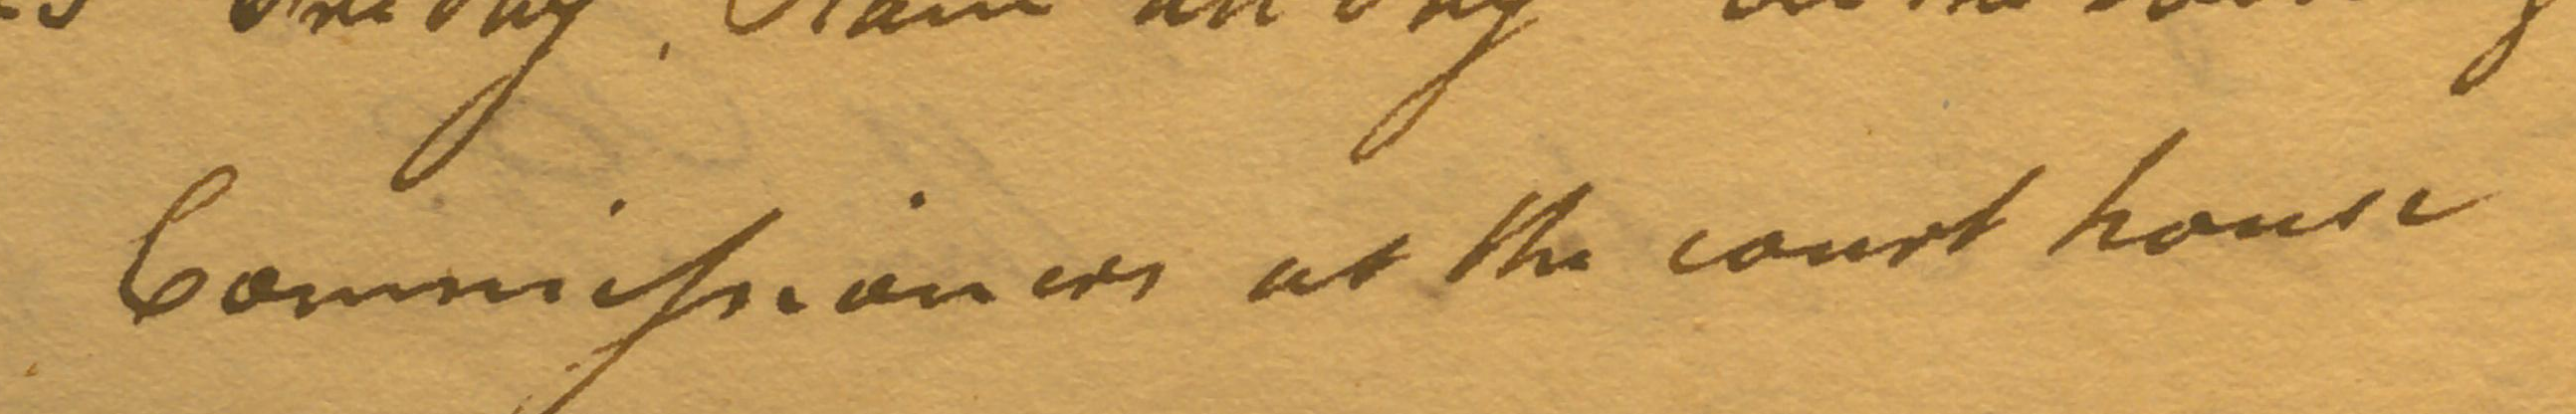Commessioners at the court house
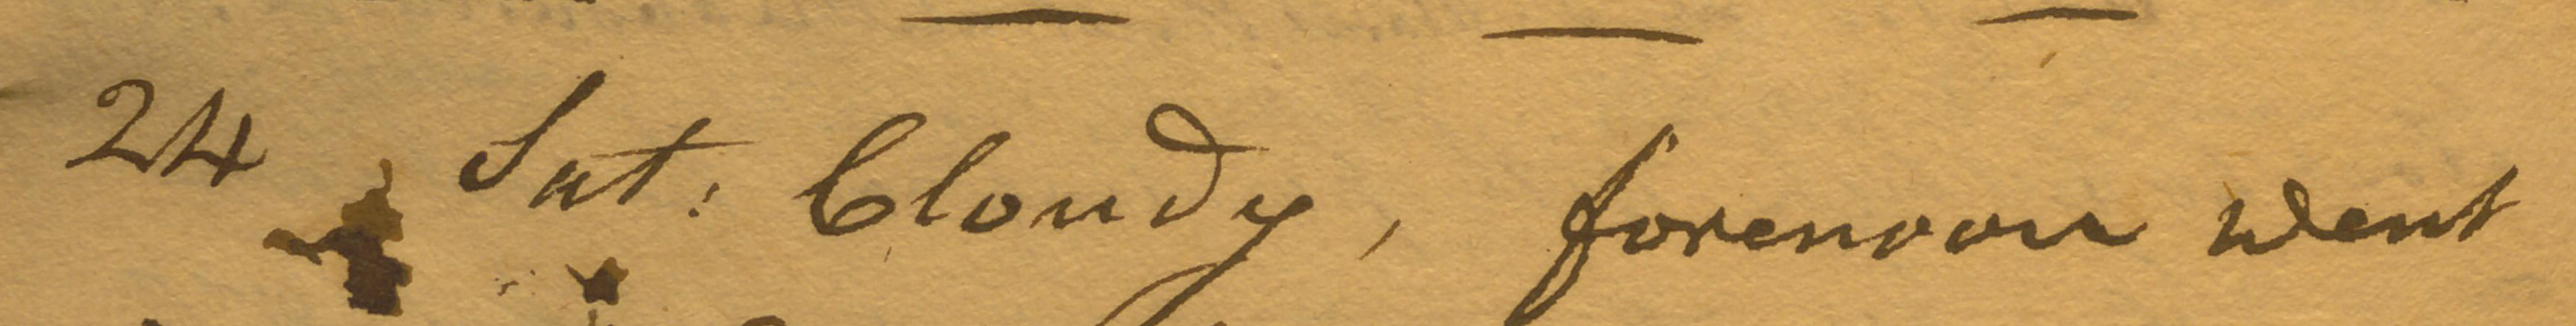24 Sat. Cloudy, forenoon went
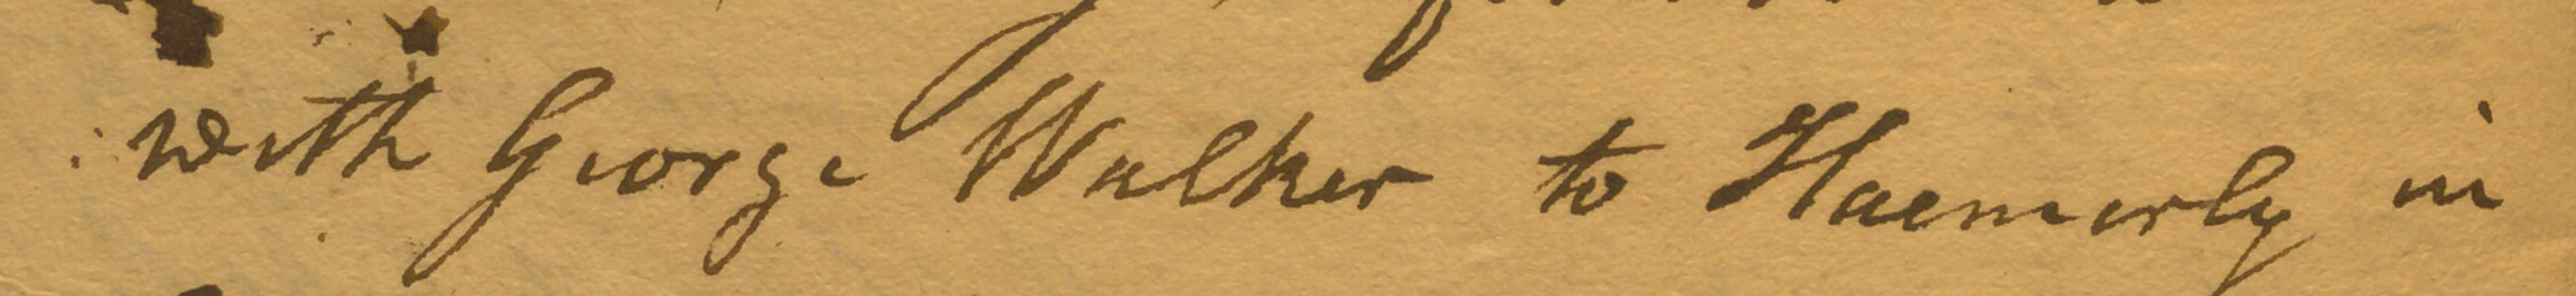with George Walker to Haemerly in
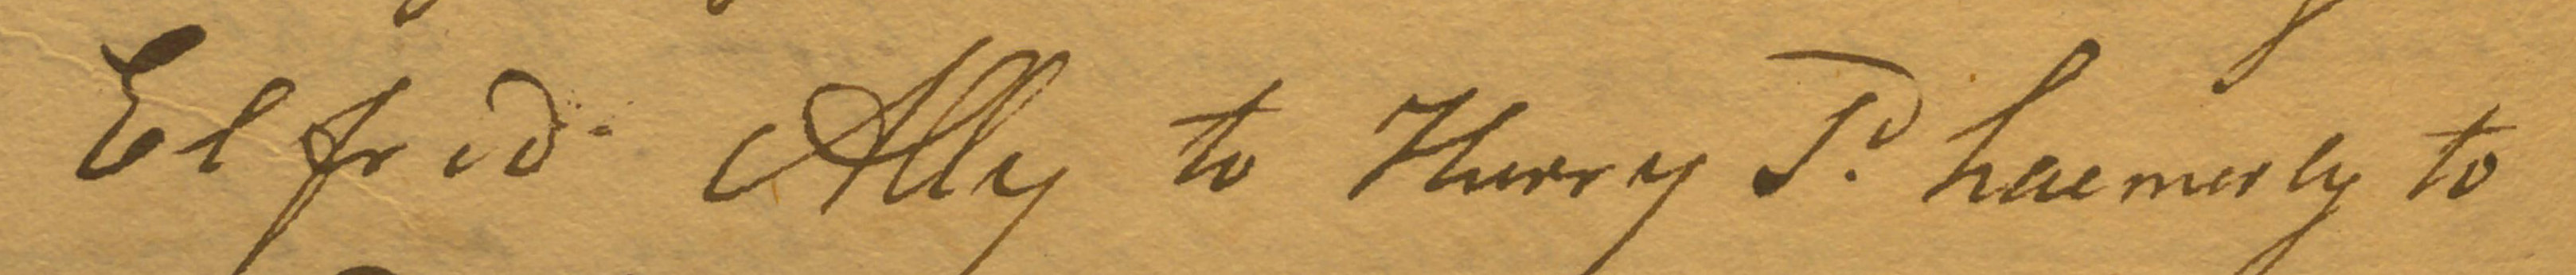Elfrid Ally to Hurry s^d. haemerly to
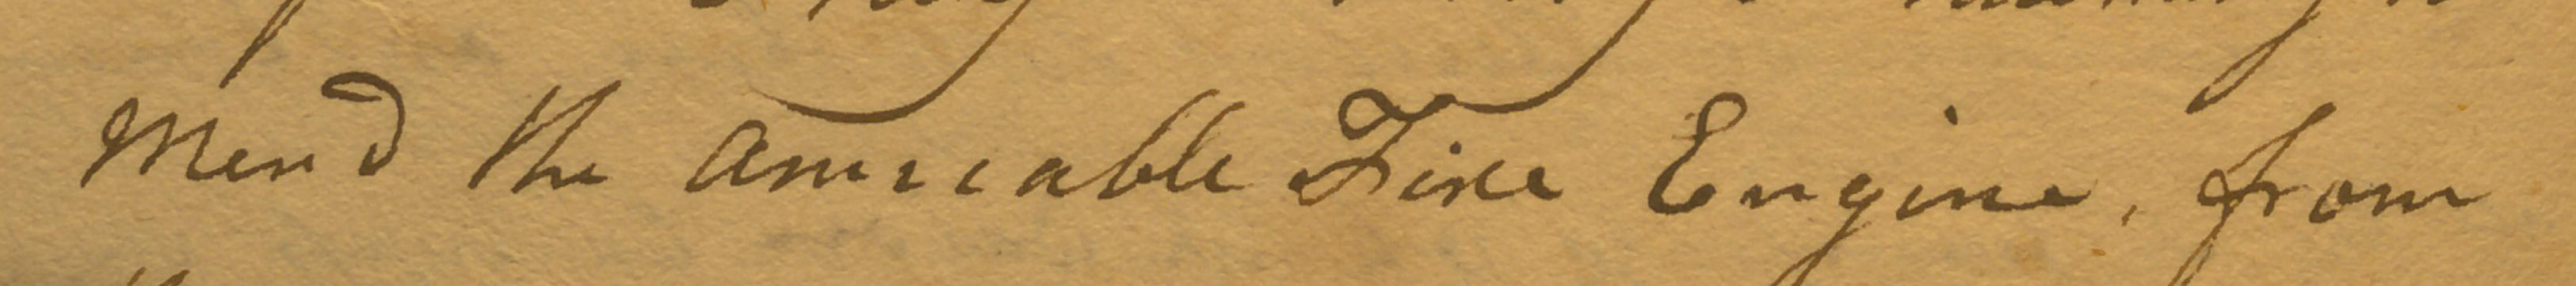Mend the Amicable Fire Engine, from
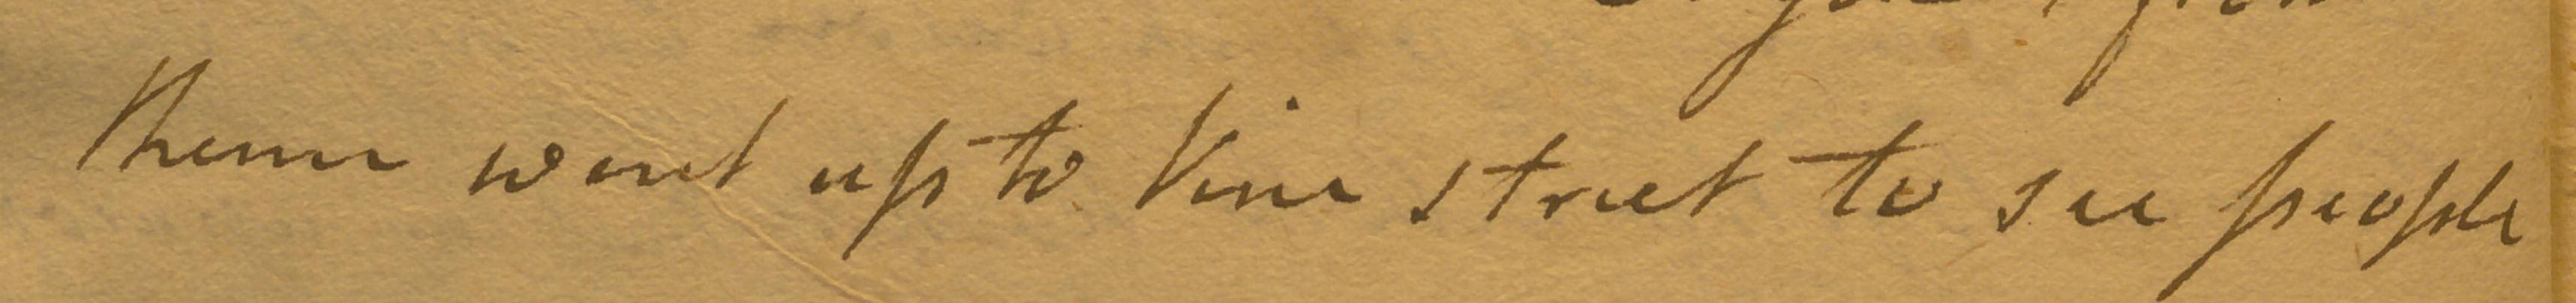thence went up to Vine street to see people
